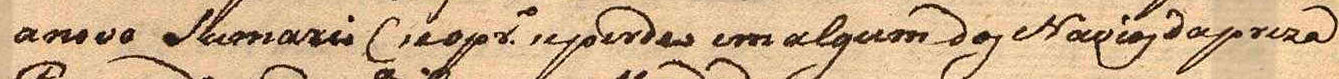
a novo Sumario (se o pr.o se perdeo em algum dos Navios da preza
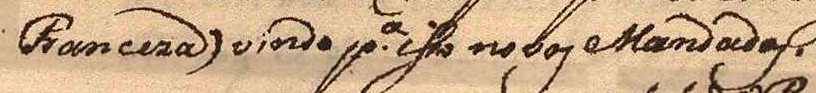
Franceza) vindo p.a isso novos Mandados.
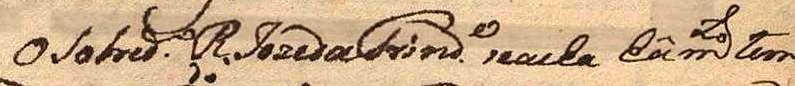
O sobred.o R. Ioze da Trind.e se acha há m.to tem
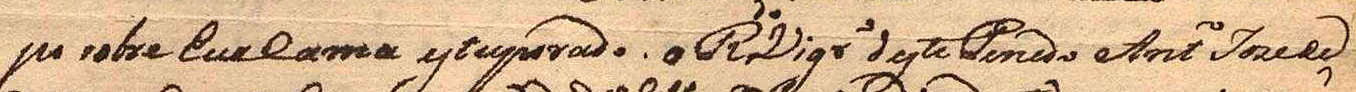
po sobre hua cama estuporado. o R.do Vigr.o deste Penedo Ant.o Ioze de
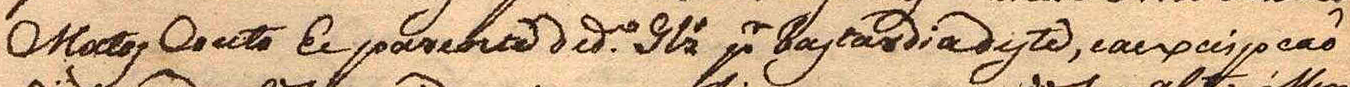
Matos Couto he parente de d.o Glz̄ p.r bastardia deste, e a excispçaõ
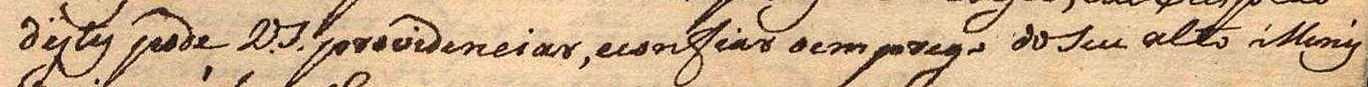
destes pode V.S. providenciar, e confiar o emprego do Seu alto Menis
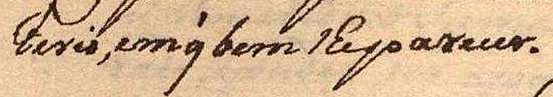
terio, em q̄ bem lhe parecer.
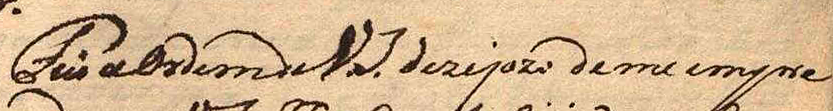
Fui a Ordem de V.S. dezejozo de me empre
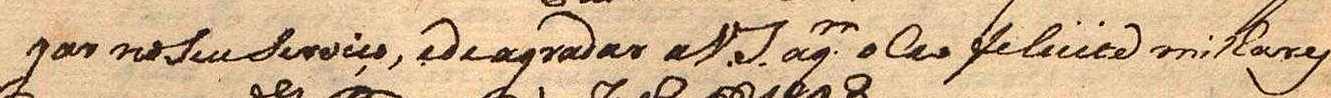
gar no seu serviço, e de agradar a V.S. a q.m o Ceo felicite milhares
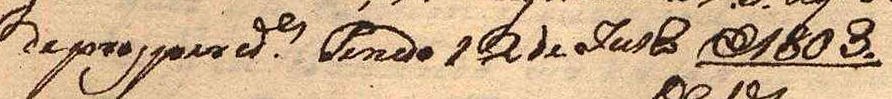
de prospered.es Penedo 12 de Iulho d̄ 1803.
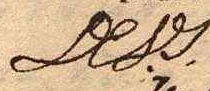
De V.S.
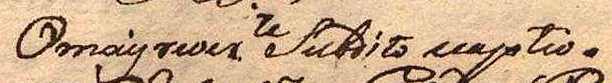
O mais rever.te Subdito e captivo
